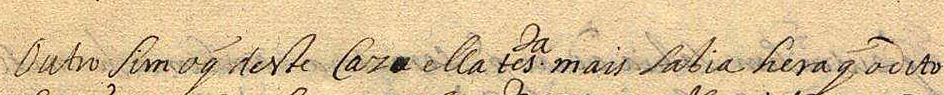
Outrosim o q̄ deste Cazo ella tes.ta mais sabia hera q̄ o dito
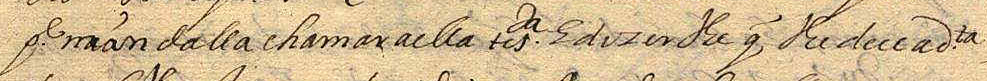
p.e mandalla chamar a ella testa. E dizerlhe q̄ lhe dece a d.ta
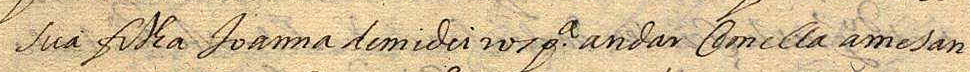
sua filha Joanna de mideiros p.a andar Com ella amesan
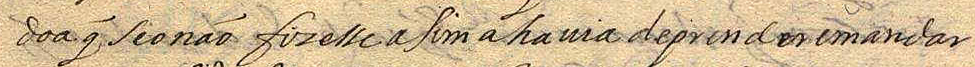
doa q̄ se o naõ fizesse asim a hauia de prender e mandar
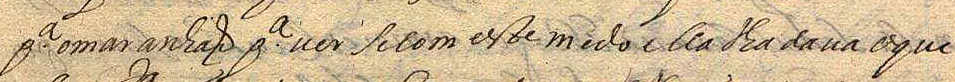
p.a o maranhaõ p.a uer se com este medo ella lha daua o que
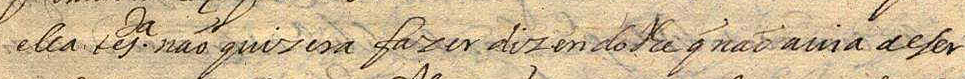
ella tes.ta naõ quizera fazer dizendolhe q̄ naõ auia de ser
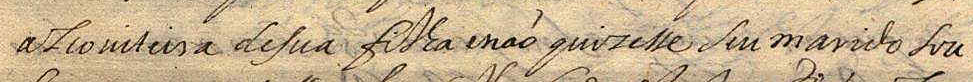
alcouiteira de sua filha e naõ quizesse seu marido sou
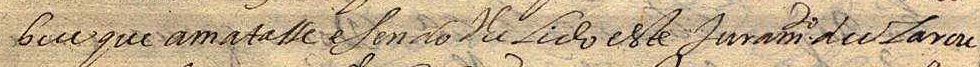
bece que a matasse, e sendo lhe Lido este Juram.to declarou
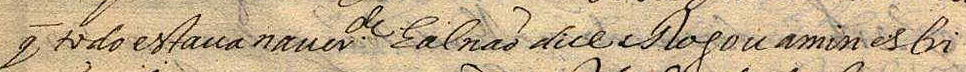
q̄ todo estaua na uer.de E al naõ dice e Rogou a min esCri
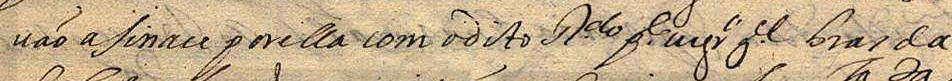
uaõ asinace por ella com o dito R.do p.e uigr.o g.al bras da
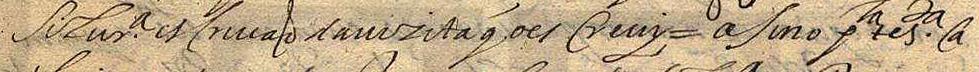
Silur.a esCriuaõ da uizita q̄ o esCreuy = asino pla testa. Ca
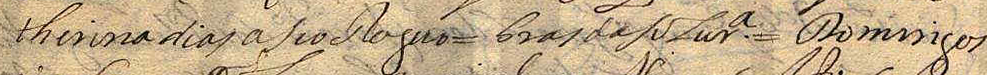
therina dias a seo Roguo = bras da Silur.a = Domingos
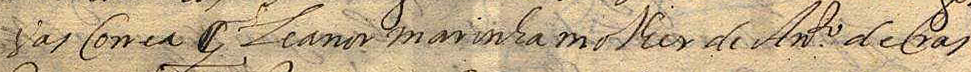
Vas Correa ¶ Leanor marinha molher de An.to de Cras
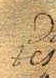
testa
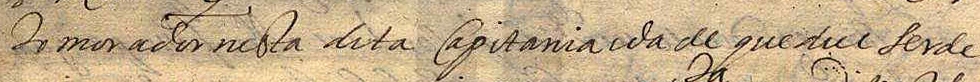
to morador nesta dita Capitania idade que dice ser de
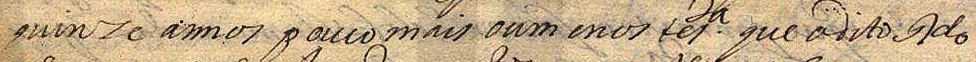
quinze annos pouco mais ou menos testa que o dito Rdo
